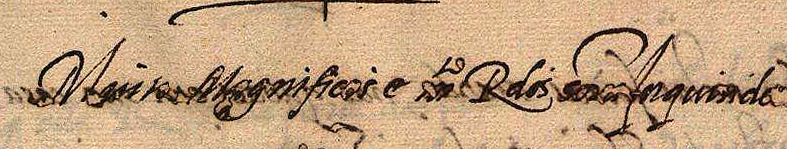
Muito Magnificos e mto Rdos snrs̄ Jnquisidores
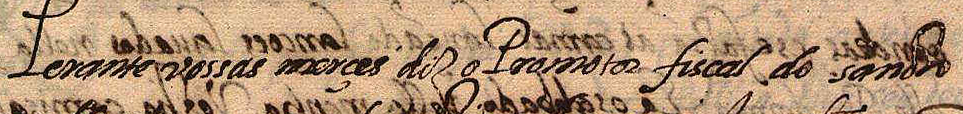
Perante vossas merçes diz o Promotor fiscal do sancto
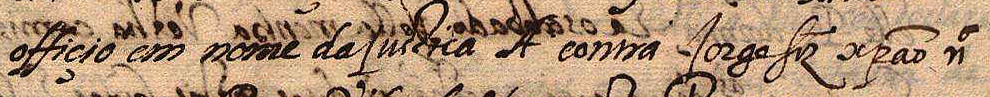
offiçio em nome da Justica A contra Jorge frz̄ xpão no
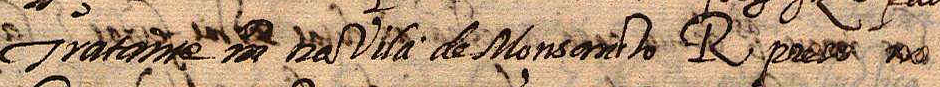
Tratante mor na Vila de Monsancto R. preso no
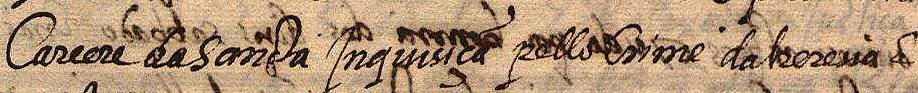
Carcere da sancta Jnquisiçā pello Crime da heresia E
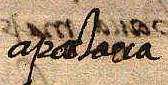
apostazia
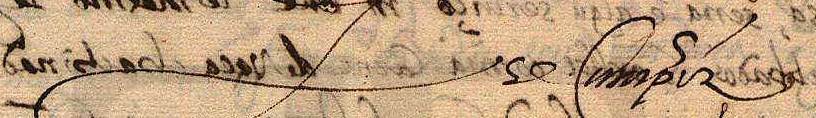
E se Cump̄ir
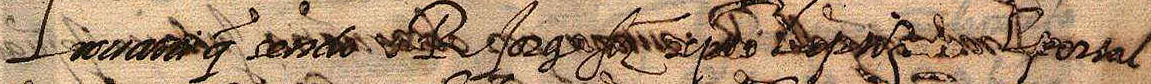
Prouara q̄ sendo o R Jorge frz̄ xpão baptiz_ E por tal
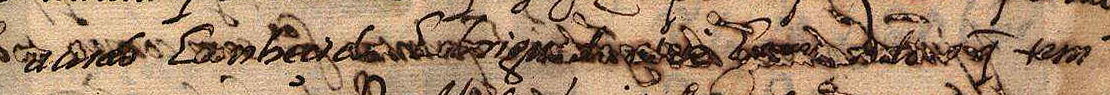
auido E conhecido E obriguado a ter E crer tudo o q̄ tem
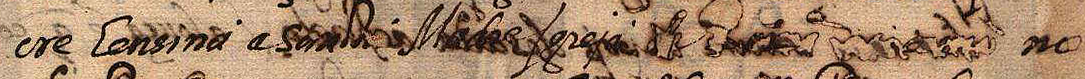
cre E ensina a sancta Madre Jgreja _ _ _ no
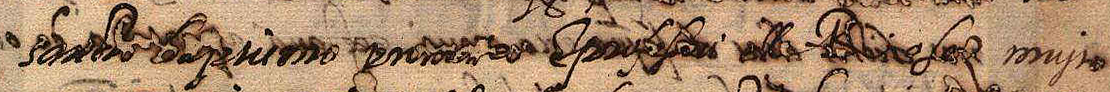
sancto baptismo prometeo e profesou elle Reo o fez mujto
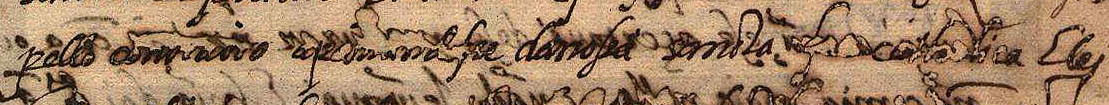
pello contrairo apartandosse da nossa sancta fe catholica E lej
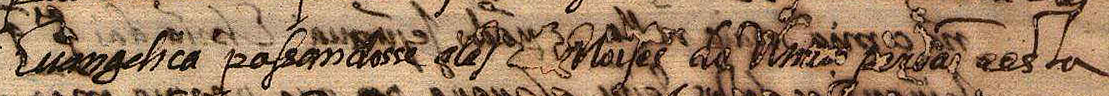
Euangelica passandosse a lej _ Moises do Vltimo perdão a esta
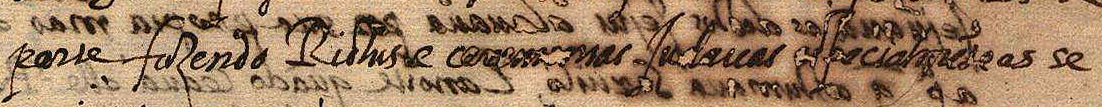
parte fazendo Rictus e ceremonias Judaicas especialmēte as se
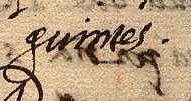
guintes.
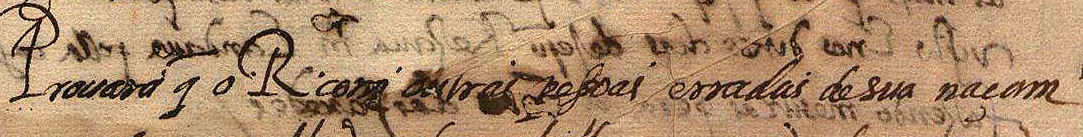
Prouara q̄ o R com outras pessoas erradas de sua naçam
